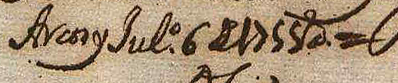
Arcos y Iul.o 6 de 1755 ā
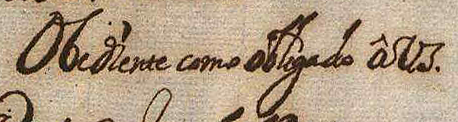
Obediente como obligado â V S.
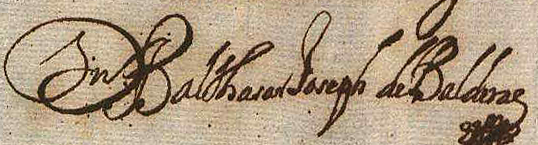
Dn Balthasar Ioseph de Balderas
